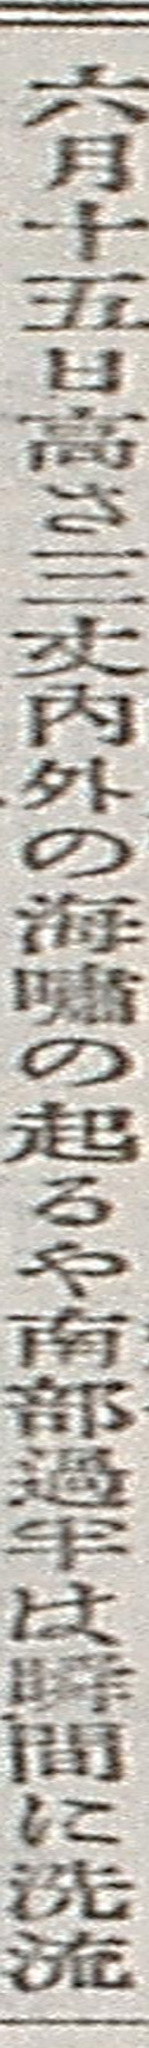六月十五日高さ三丈内外の海嘯の起るや南部過半は瞬間に洗流
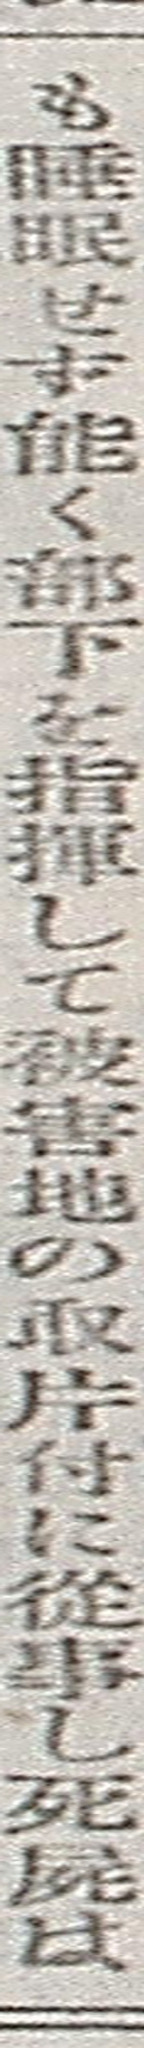も睡眠せず能く部下を指揮して被害地の取片付に従事し死屍は
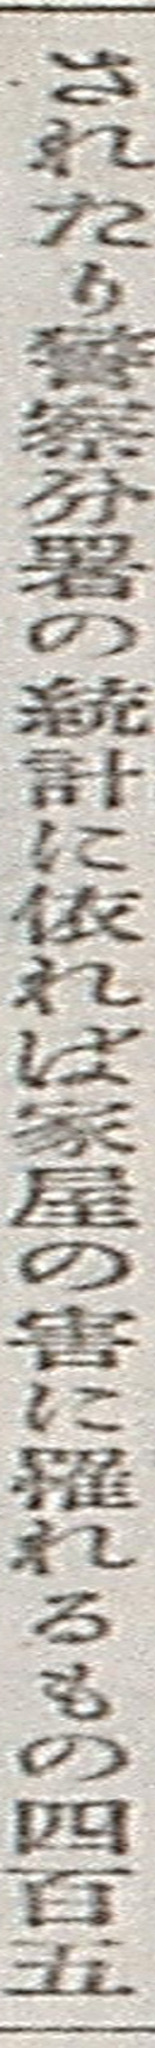されたり警察分署の統計に依れば家屋の害に罹れるもの四百五
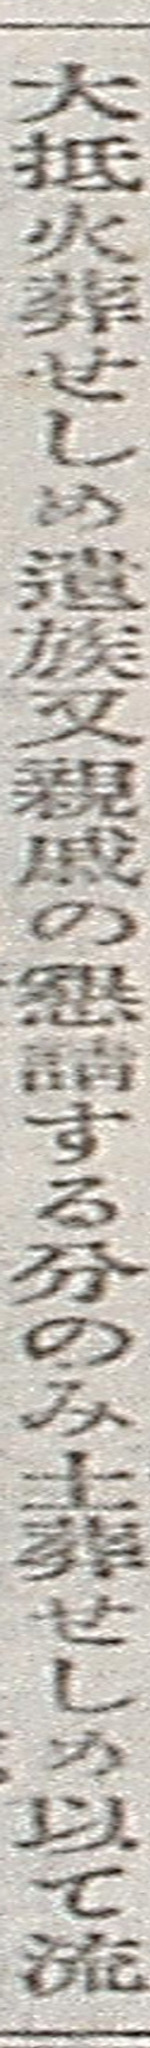大抵火葬せしめ遺族又親戚の懇請する分のみ土葬せしめ以て流
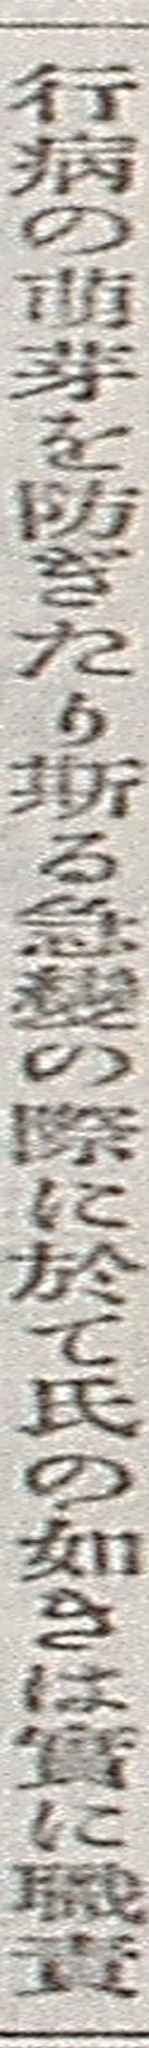行病の萌芽を防ぎたり斯る急変の際に於て氏の如きは実に職責
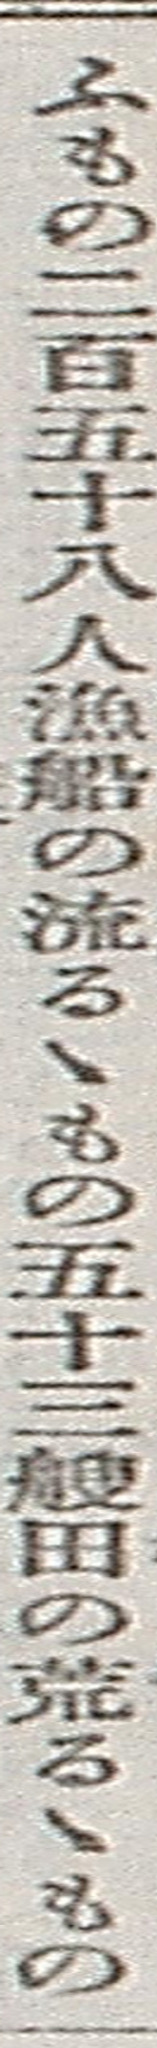ふものニ百五十八人漁船の流るゝもの五十三艘田の荒るゝもの
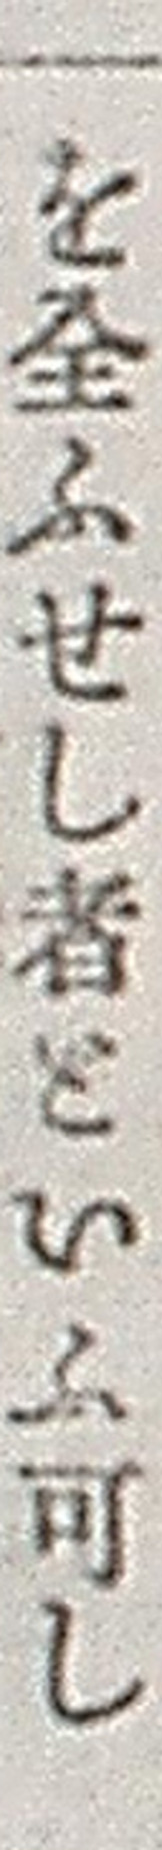を全ふせし者といふ可し
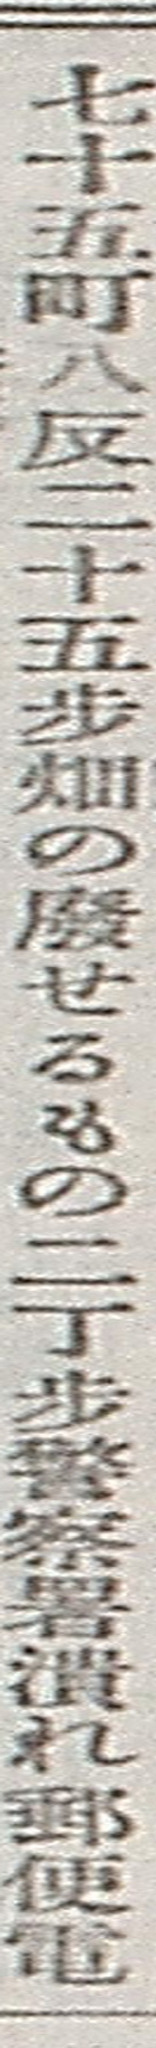七十五町八反二十五歩畑の廃せるもの二丁歩警察署潰れ郵便電
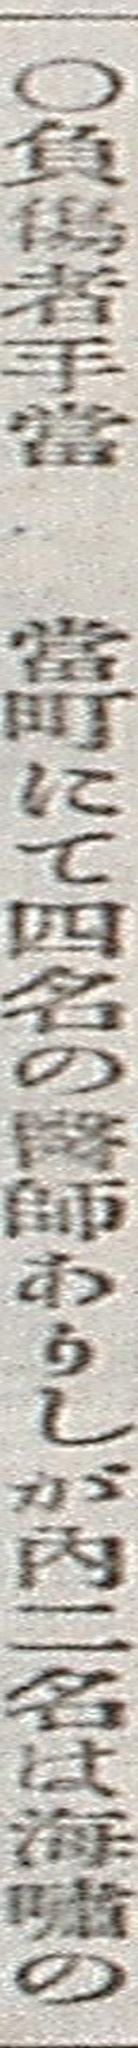○負傷者手当当町にて四名の医師ありしが内二名は海嘯の
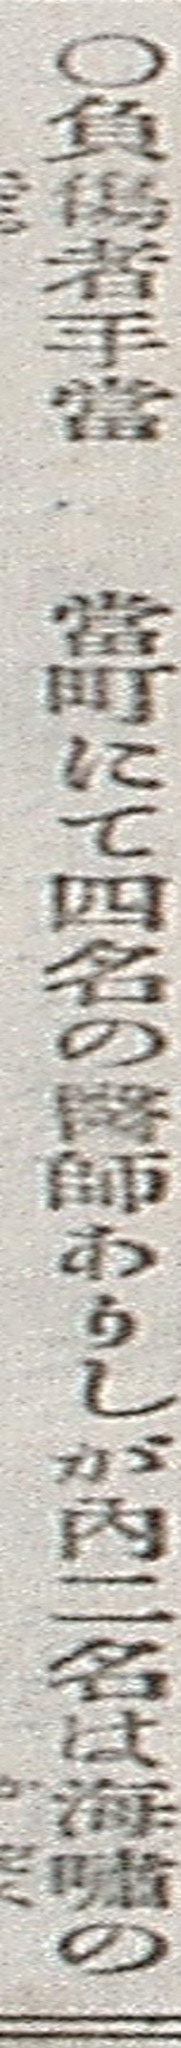○負傷者手当当町にて四名の医師ありしが内二名は海嘯の
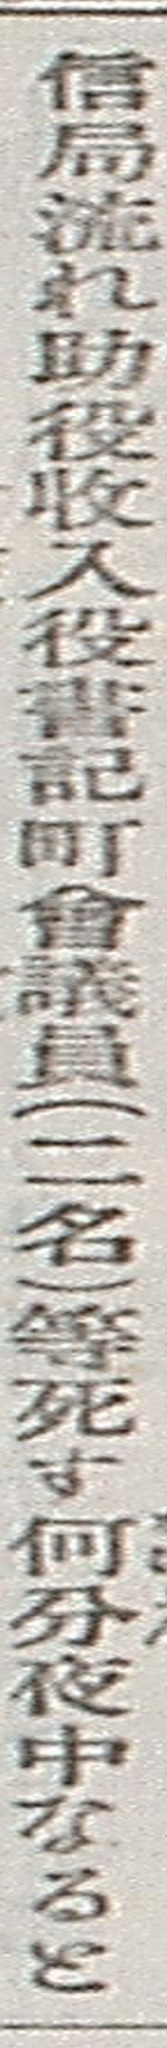信局流れ助役収入役書記町会議員等死す何分夜中なると
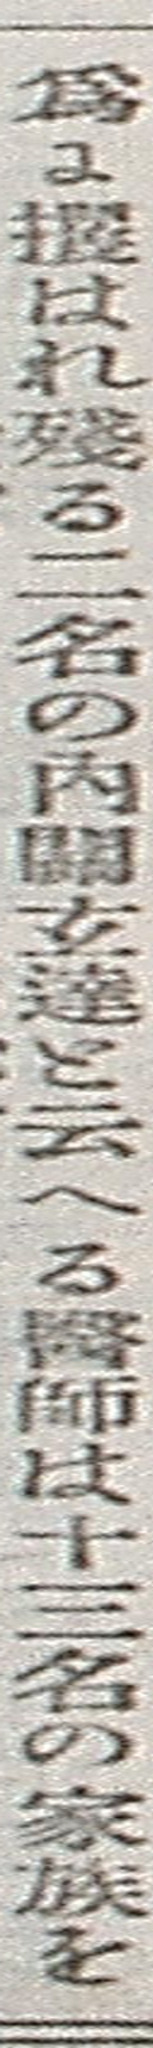為に攫はれ残る二名の内関玄達と云へる医師は十三名の家族を
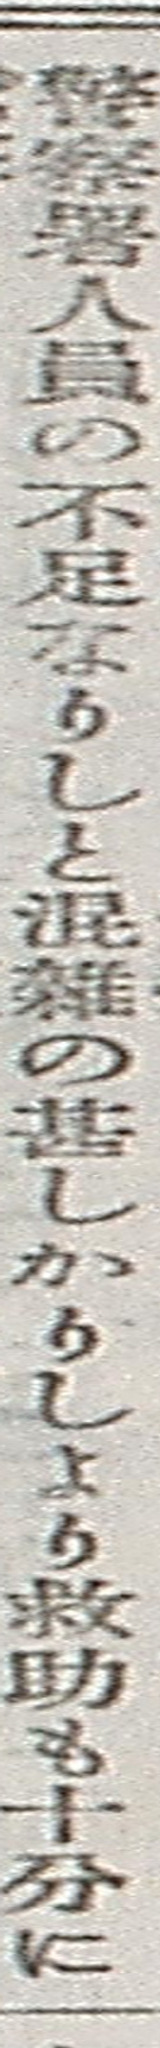警察署人員の不足なりしと混雑の甚しかりしより救助も十分に
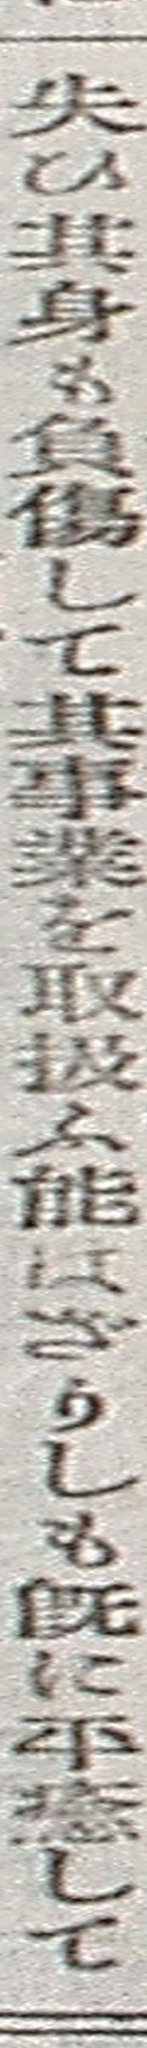失ひ其身も負傷して其事業を取扱ふ能はざりしも既に平癒して
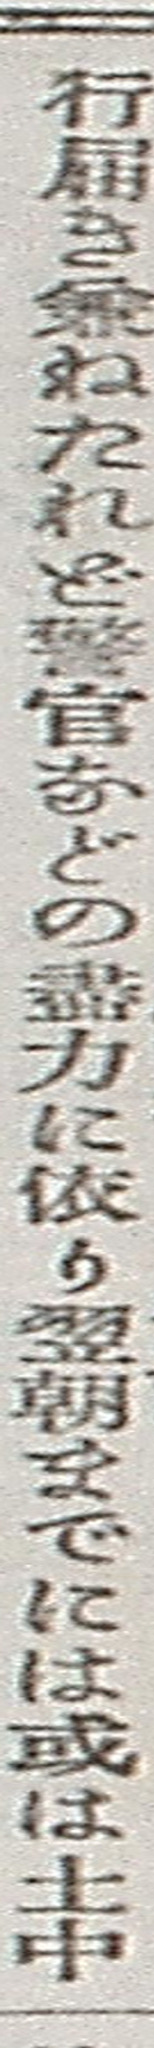行届き兼ねたれど警官などの尽力に依り翌朝までには或は土中
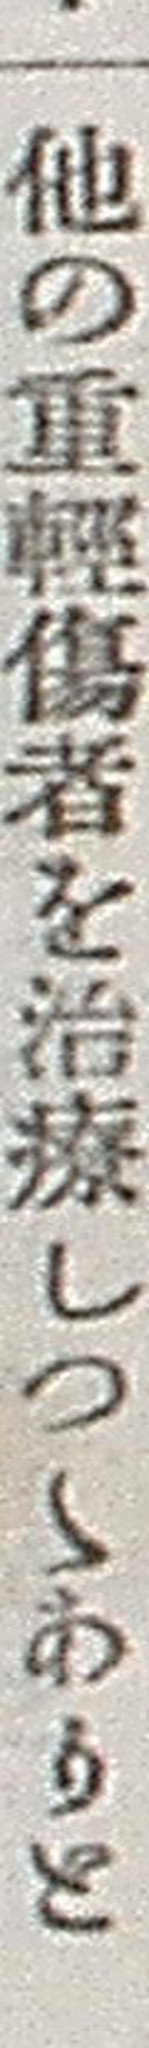他の重軽傷者を治療しつゝありと
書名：風俗畫報臨時増刊第百二十號　大海嘯被害録（下）
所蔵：東京大学地震研究所図書室 Earthquake Research Institute Library, The University of Tokyo, JAPAN
